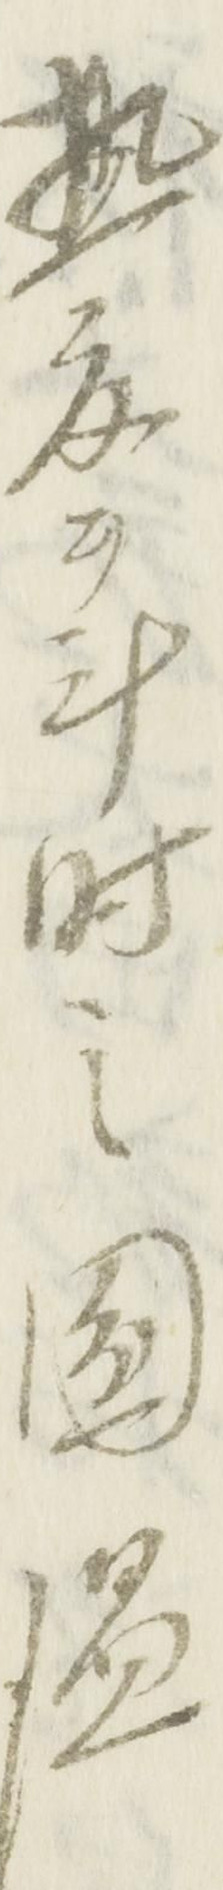熱度ヲ斗ル時之分温
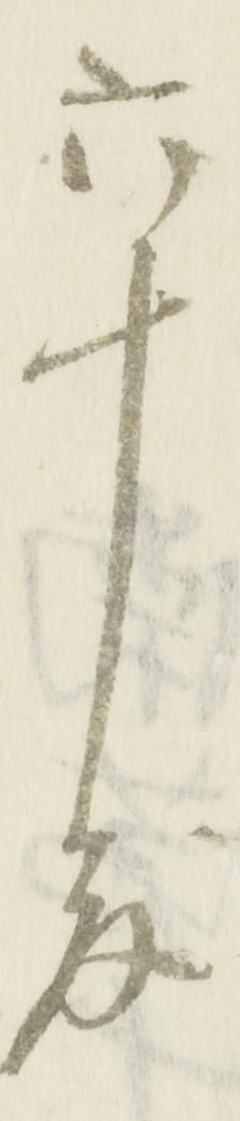六十度
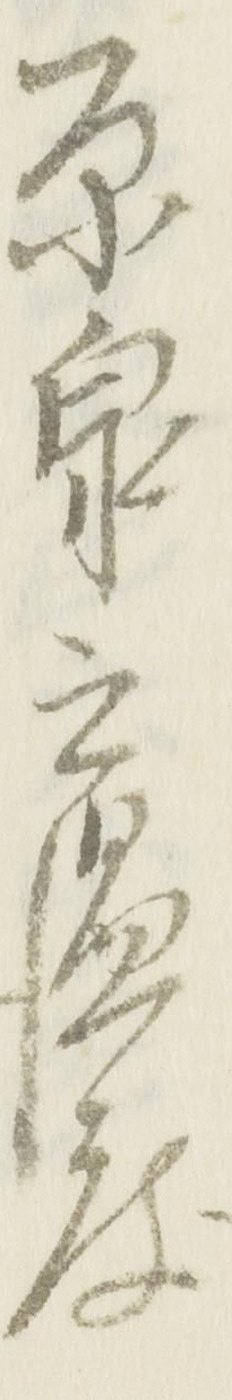原泉之温度
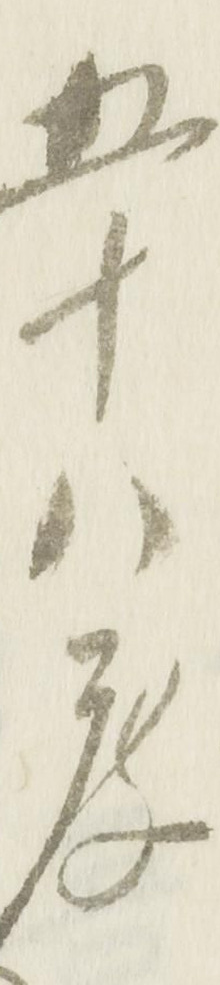五十八度
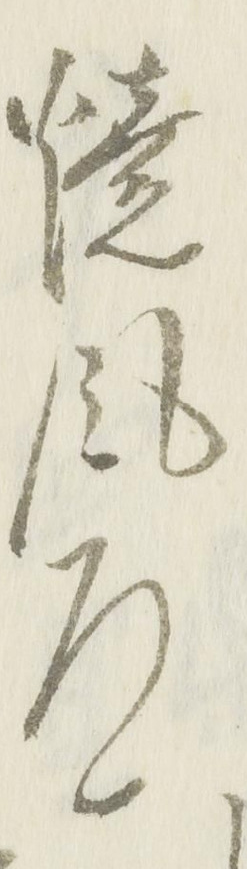焼風呂
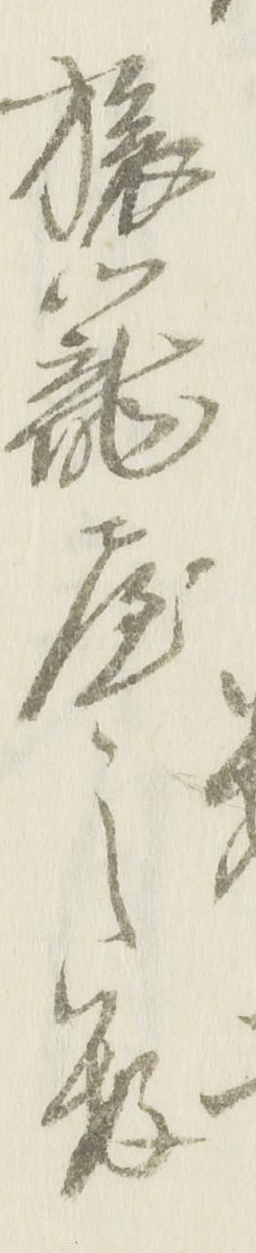旅籠屋之数
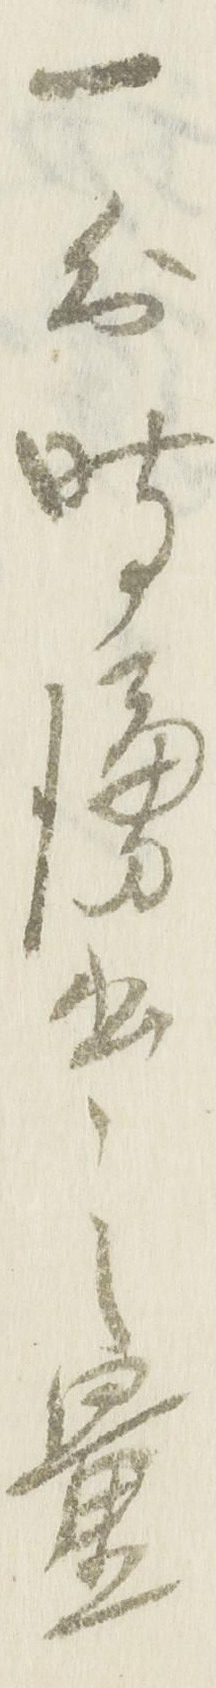一分時湧出之量
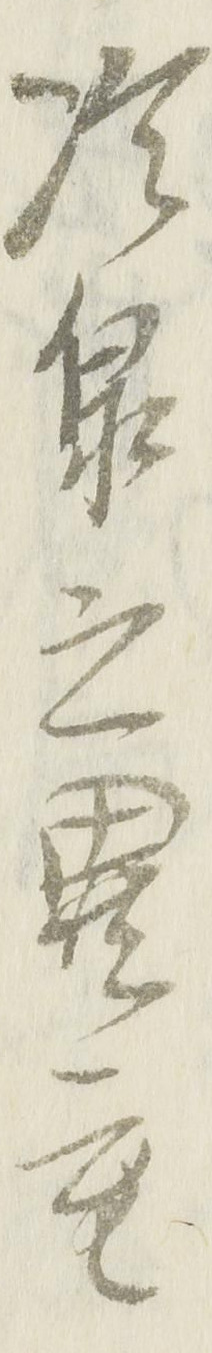冷泉之異重

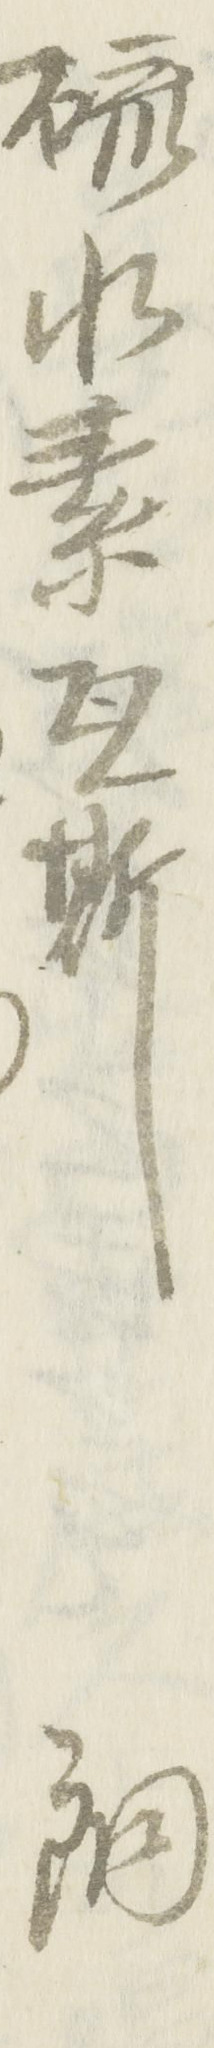硫水素瓦斯銅
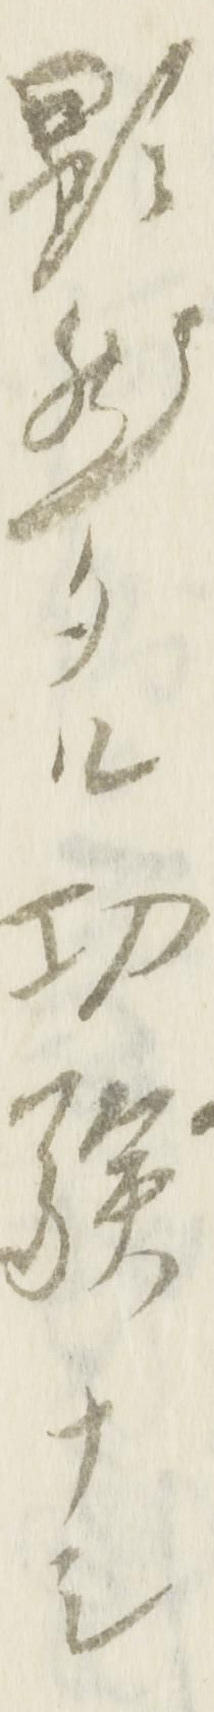確然タル功験ナシ
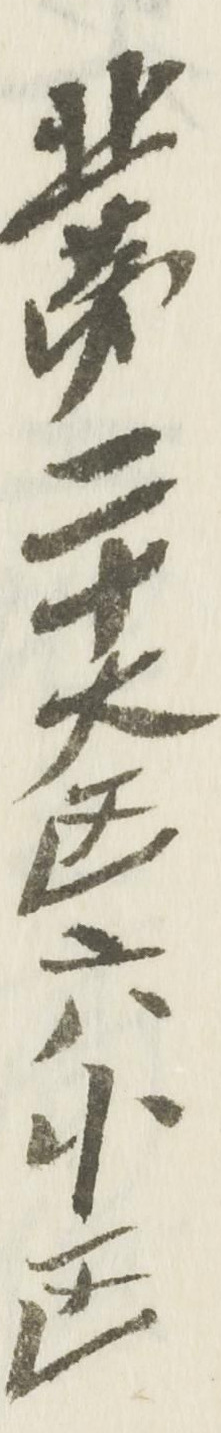北第二十大区六小区
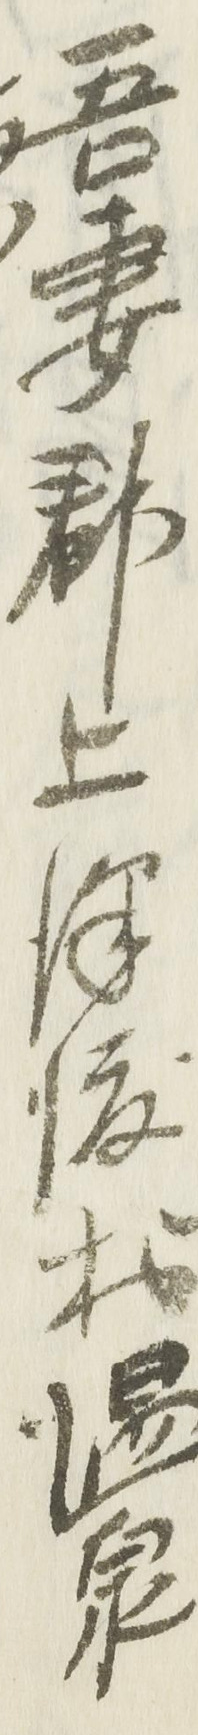吾妻郡上沢渡村温泉
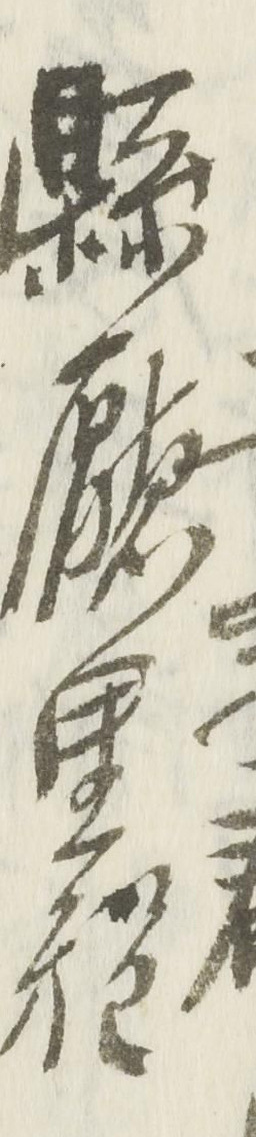県庁里程
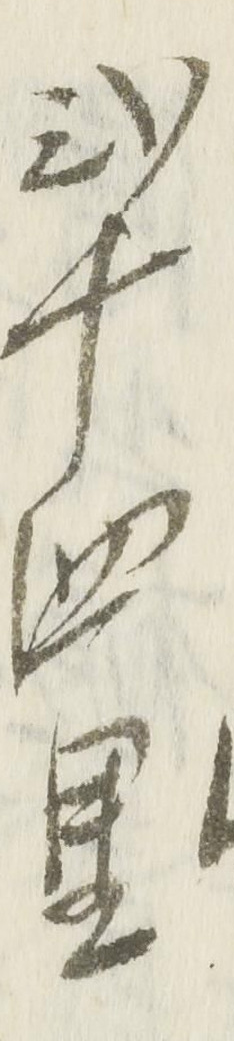弐千四里
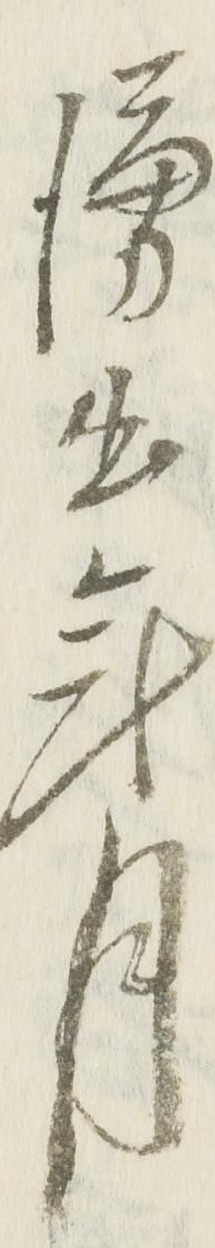湧出年月
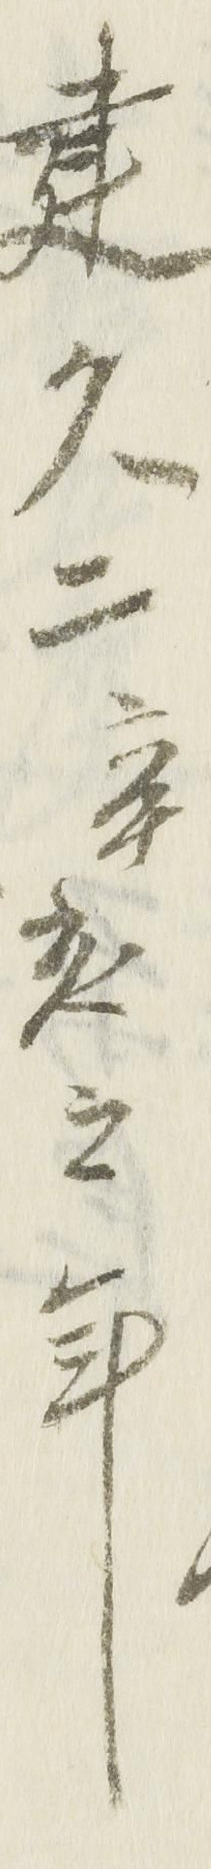建久二辛亥之年
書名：温冷泉試験表
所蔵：東京大学地震研究所図書室 Earthquake Research Institute Library, The University of Tokyo, JAPAN
